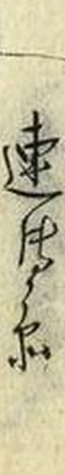連伝兵衛
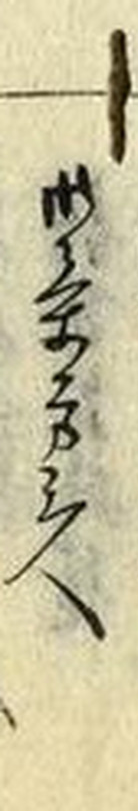御茶方三人
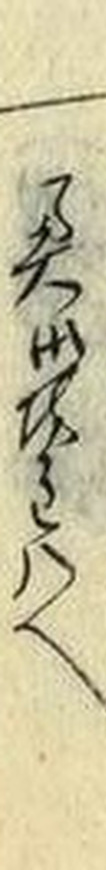奥御坊主八人
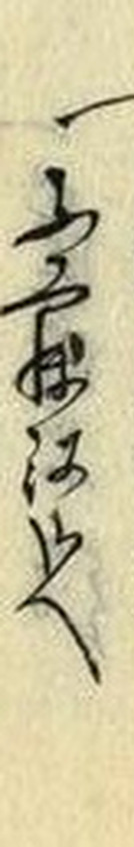不寝役弐人
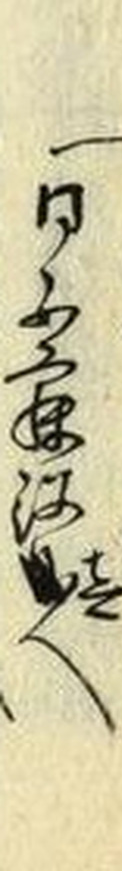同不寝役壱人
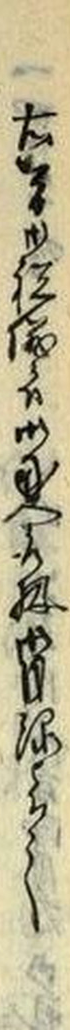右今日御祝儀ニ付御用人取扱御目録被下之
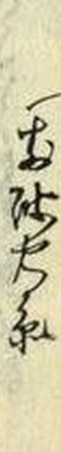前波忠兵衛
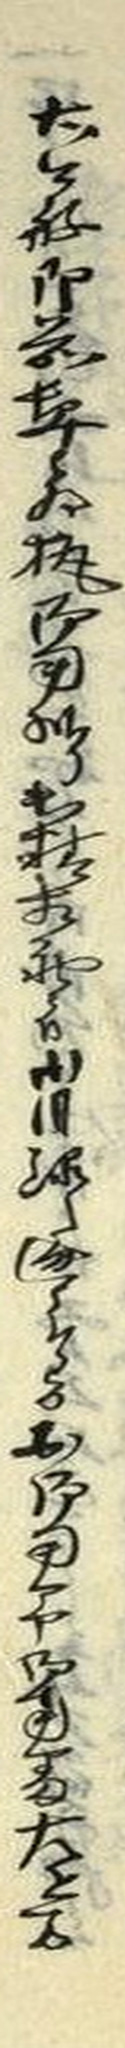右今般御前髪被為執御用掛り出精相勤候ニ付御目録之通被下候旨於御用部屋御用番左近方
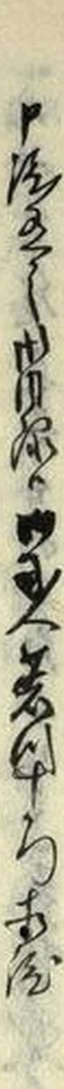申渡有之御目録ハ御用人荒川十右衛門相渡
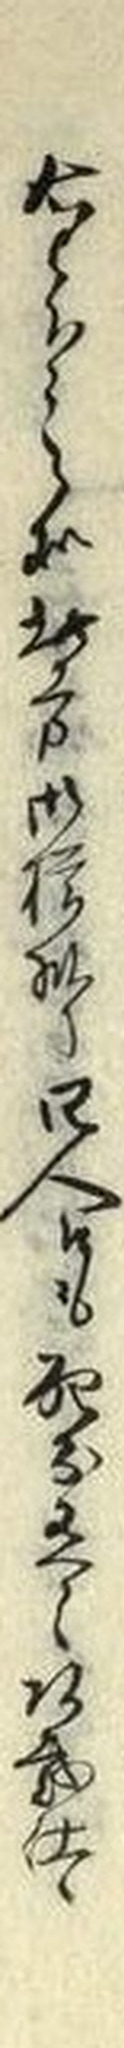右被下之候処此方御櫛掛り四人江も配分有之頂戴仕候
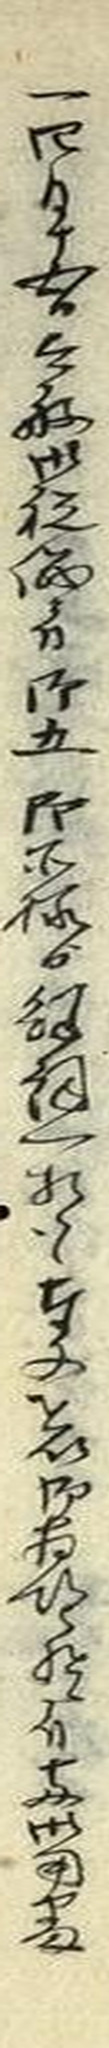一四月十五日今般御祝儀ニ付御五御所様ゟ鮮鯛一折ツヽ奉文を以御拝領被遊候ニ付両御用番
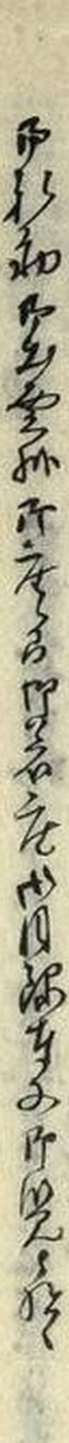御礼勤御出殿掛御座之間御着座御目録奉文御覧被遊候
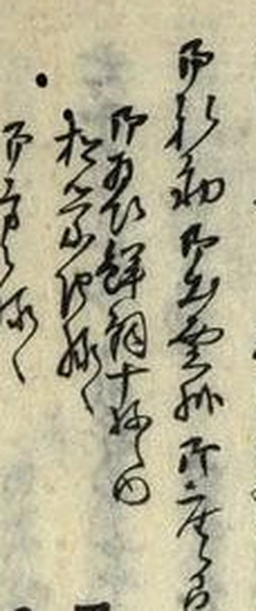御拝領鮮鯛十枚之内
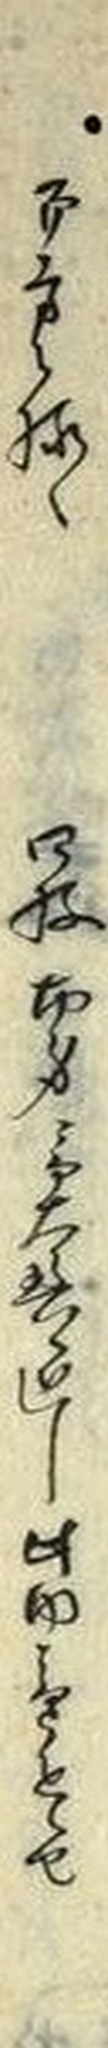御方々様へ四枚切身ニ而大奥へ廻し此内ニ而被進候由

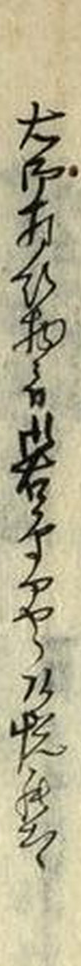右御拝領物ニ付御右筆部屋へ恐悦罷出候
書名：少傅日録抄（斉善付側向頭取日記、在府）
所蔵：福井県文書館 Fukui Prefectural Archives
